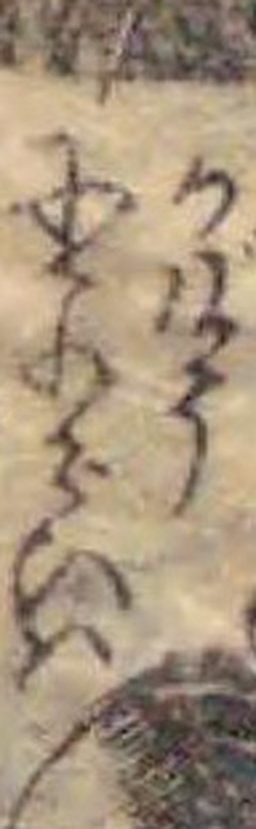によらいは
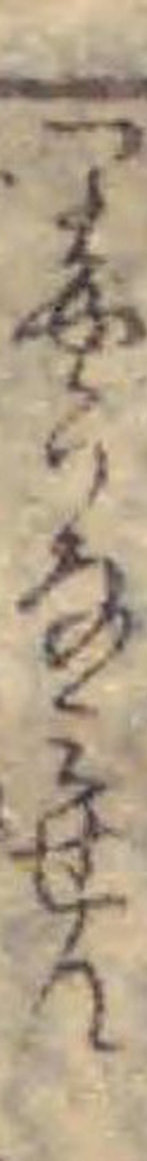りやうなみせん
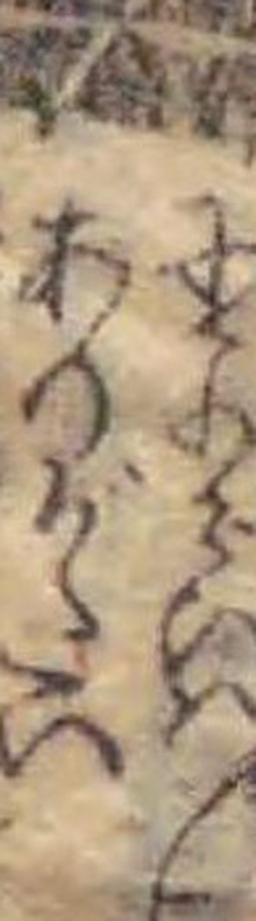ありがたい
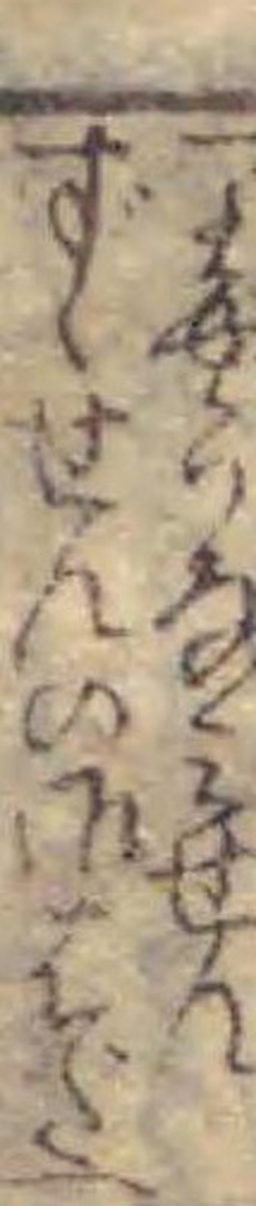づくせんの御はだへ
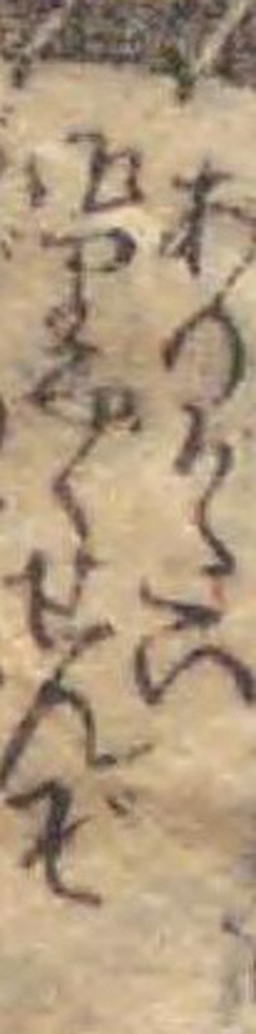御りやくせんぞ
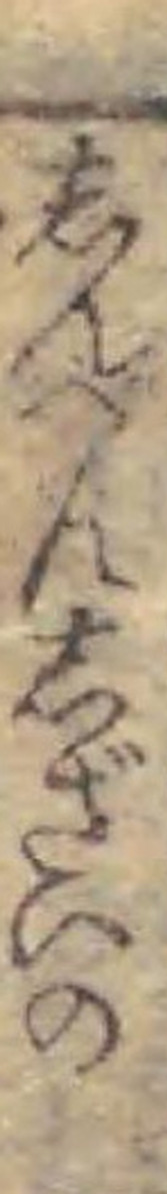しんべんしざいの
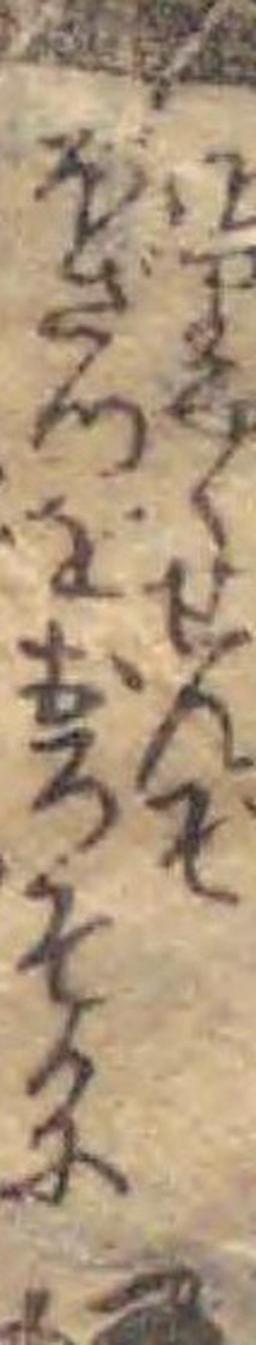ぼさつをおろそかに
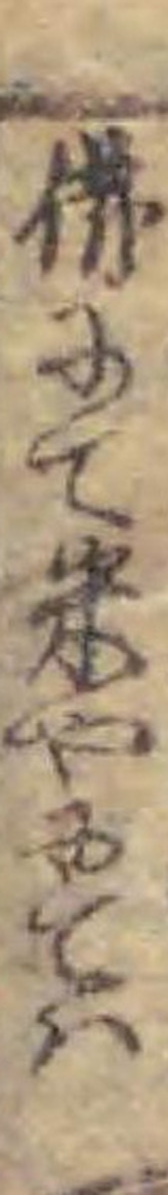仏にて米やにては
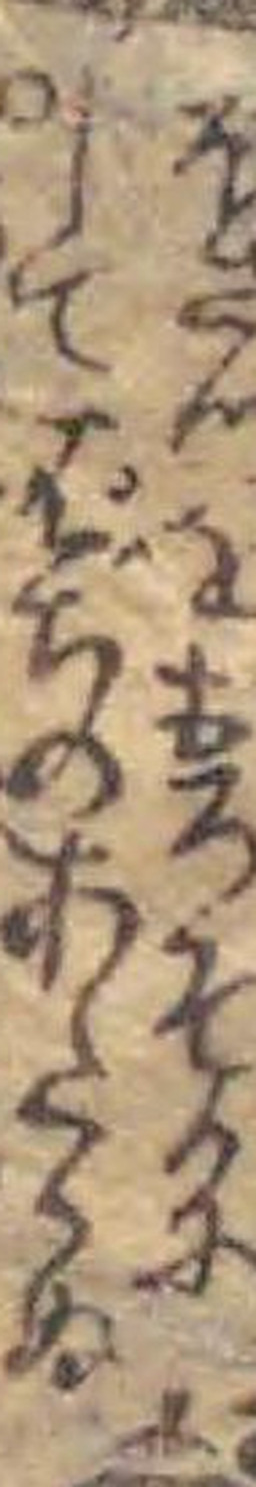してばちのあたらぬ
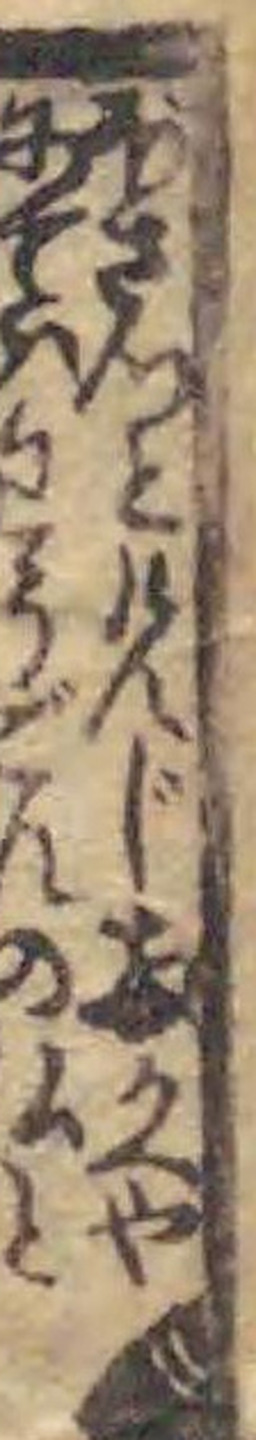にてはわうごんの仏と
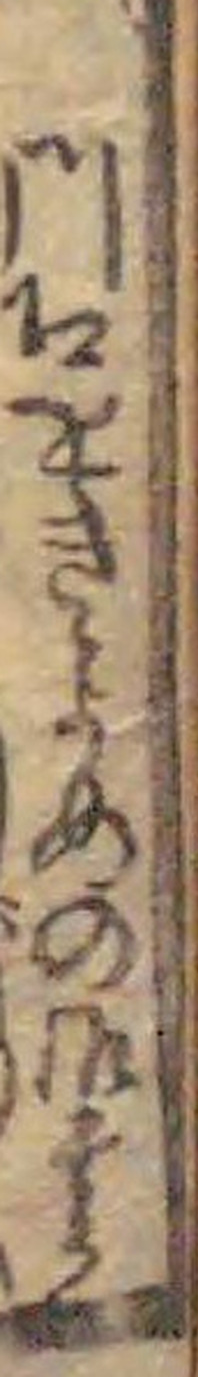門石をきよめの御そう
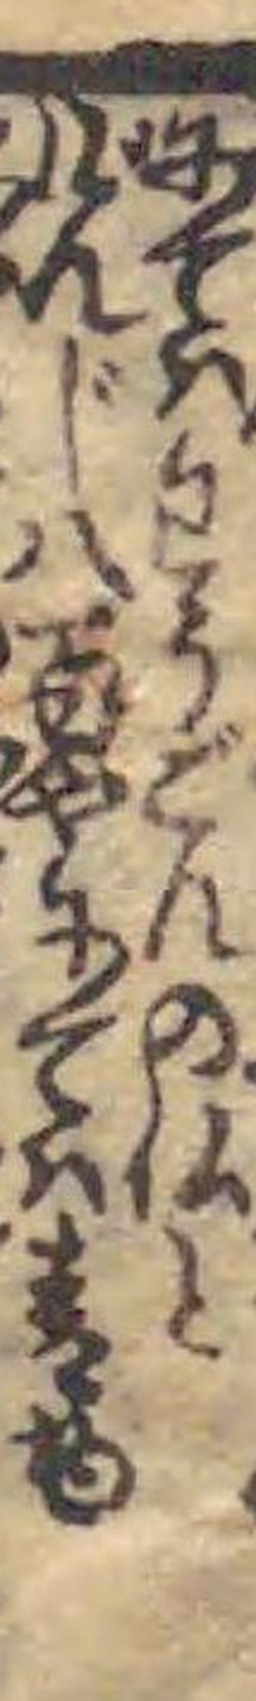げんじ八百屋にては青物
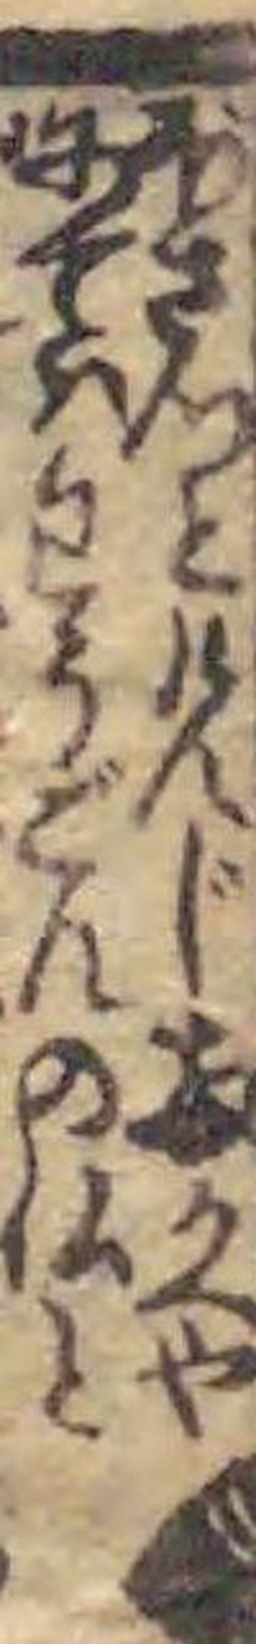にてはわうごんの仏と
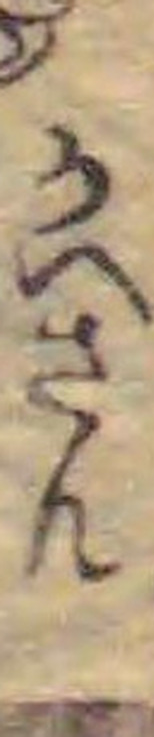かへさん
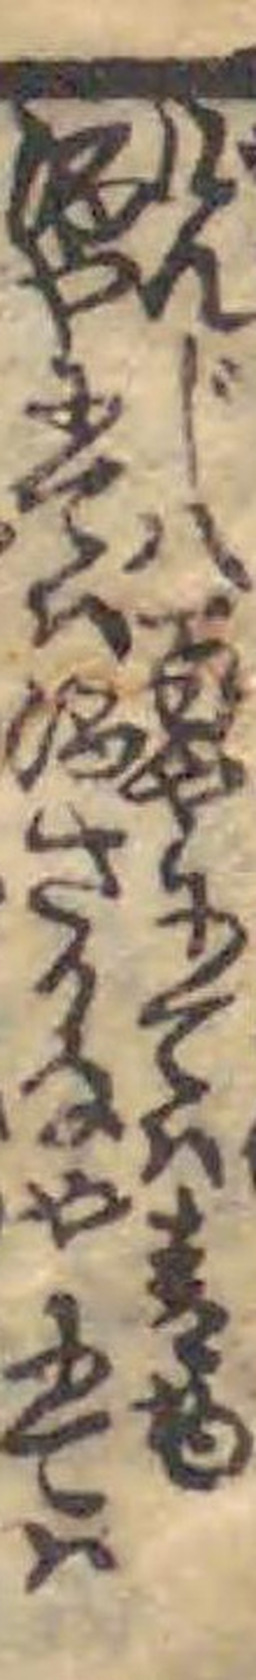酒やにては酒さかなやにては
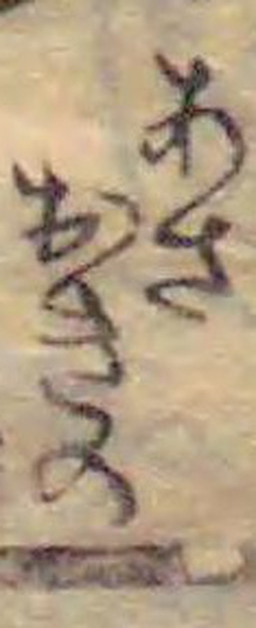おきの
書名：身体開帳略縁起 : 3巻
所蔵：国立国会図書館 National Diet Library, JAPAN
